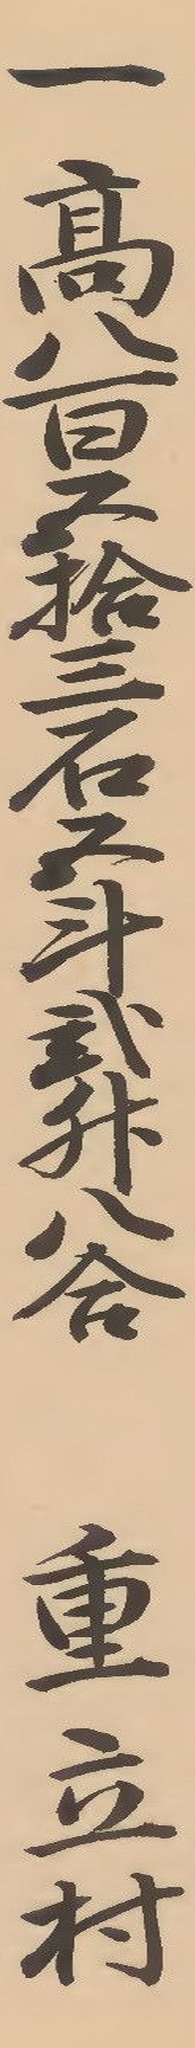一高八百五拾三石五斗弐升八合重立村
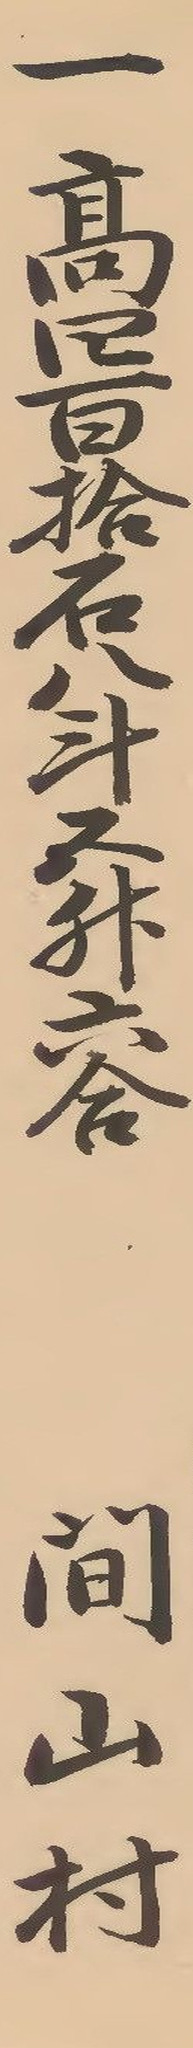一高九百壱石五斗五升丸山村
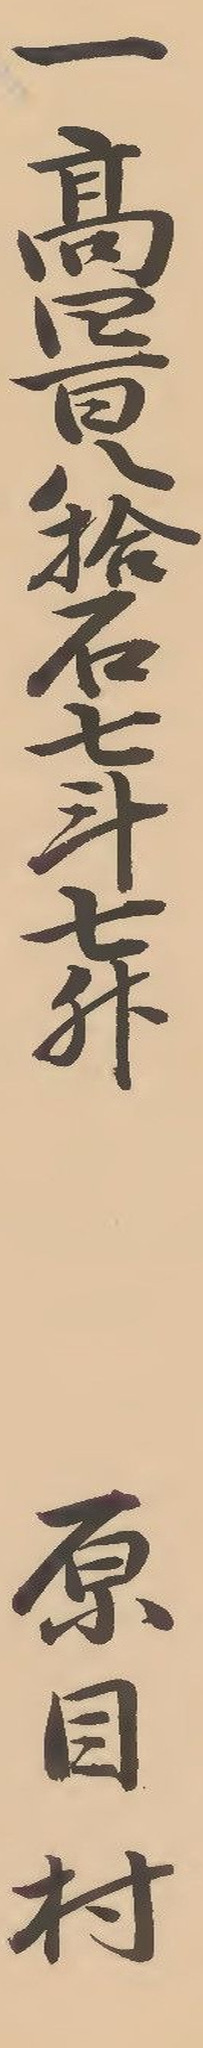一高四百八拾石七斗七升原目村

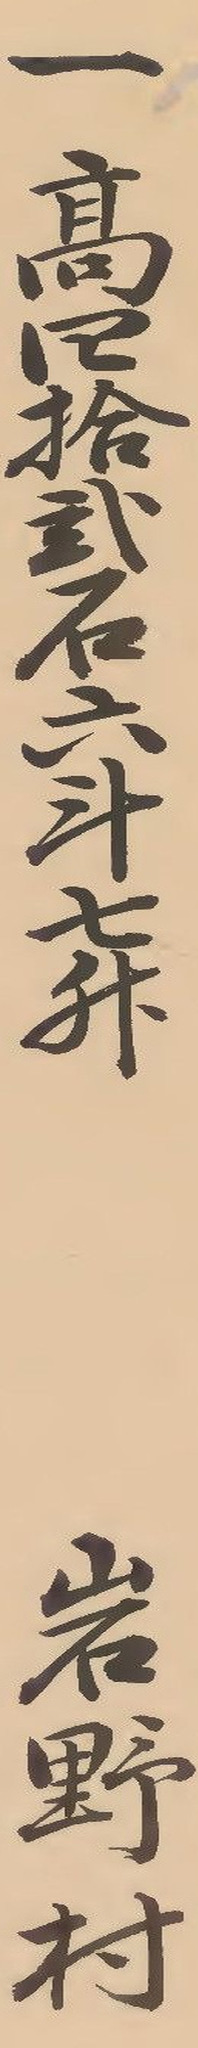一高四拾弐石六斗七升岩野村
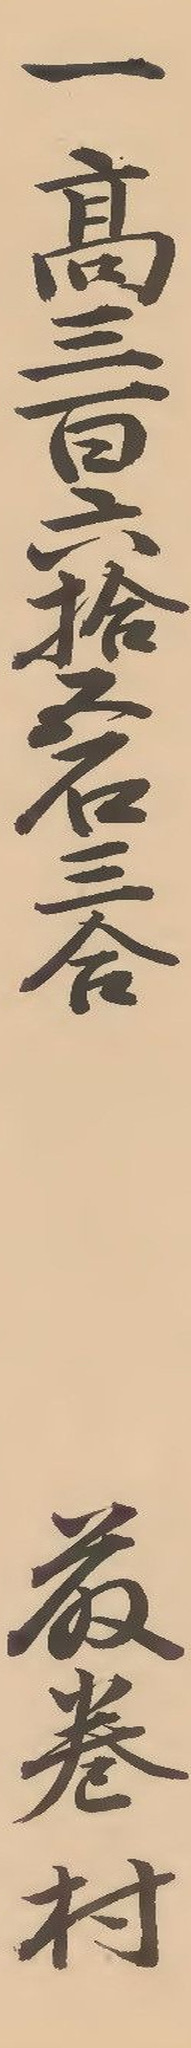一高三百六拾五石三合藤巻村
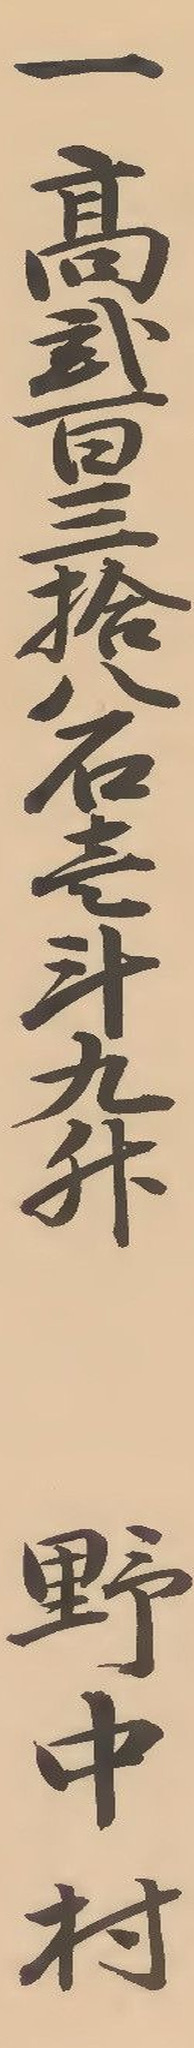一高弐百三拾八石壱斗九升野中村
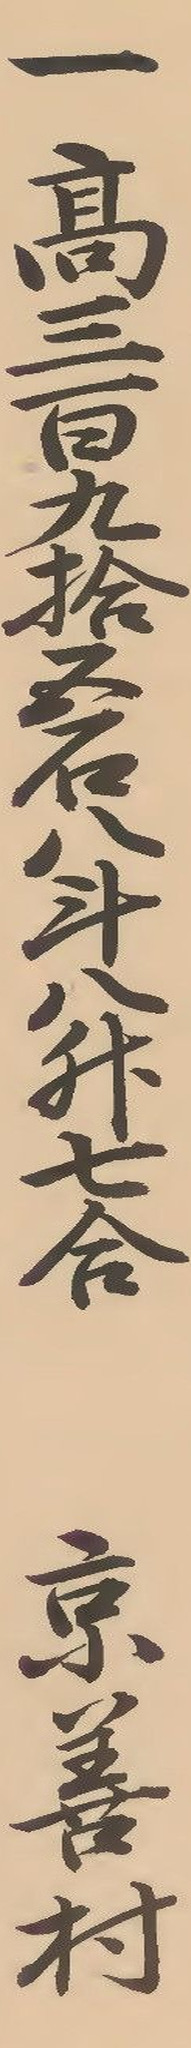一高三百九拾五石八斗八升七合京善村
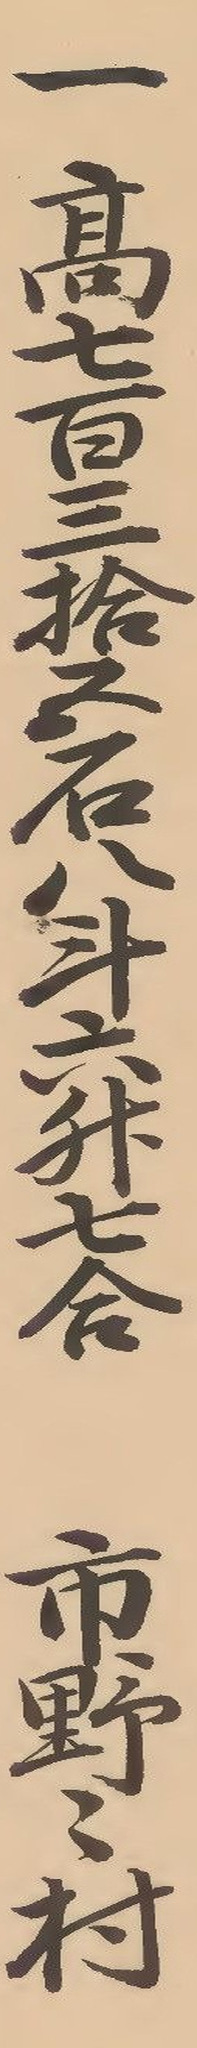一高七百三拾五石八斗六升七合市野々村
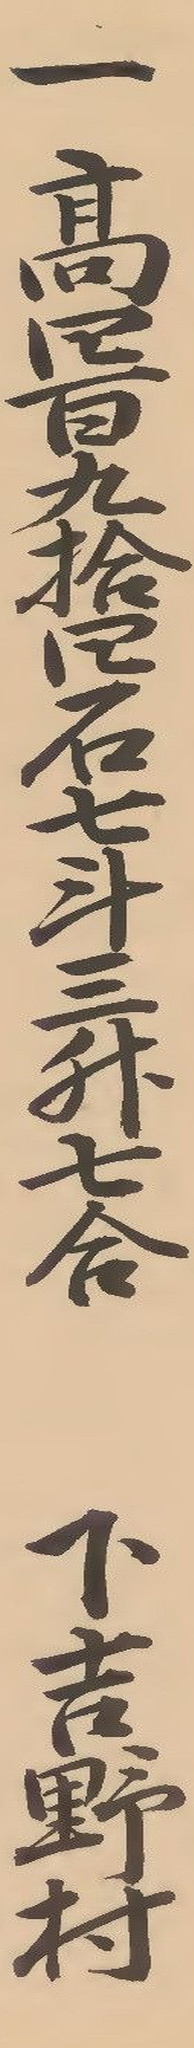一高四百九拾四石七斗三升七合下吉野村
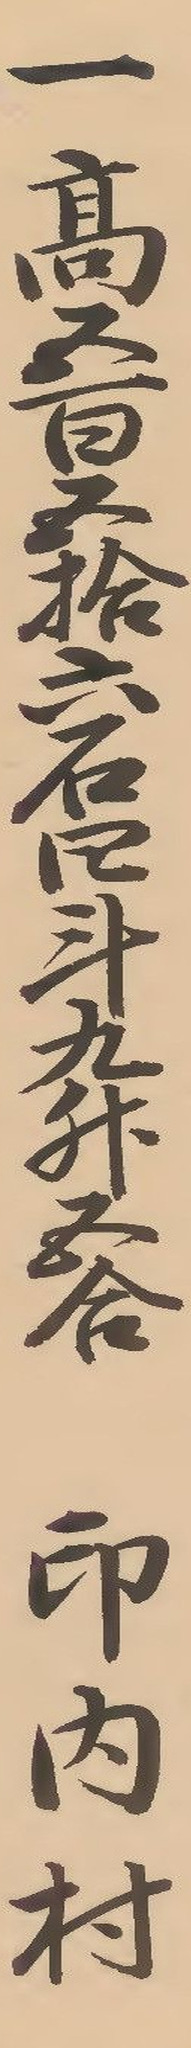一高五百五拾六石四斗九升五合印内村

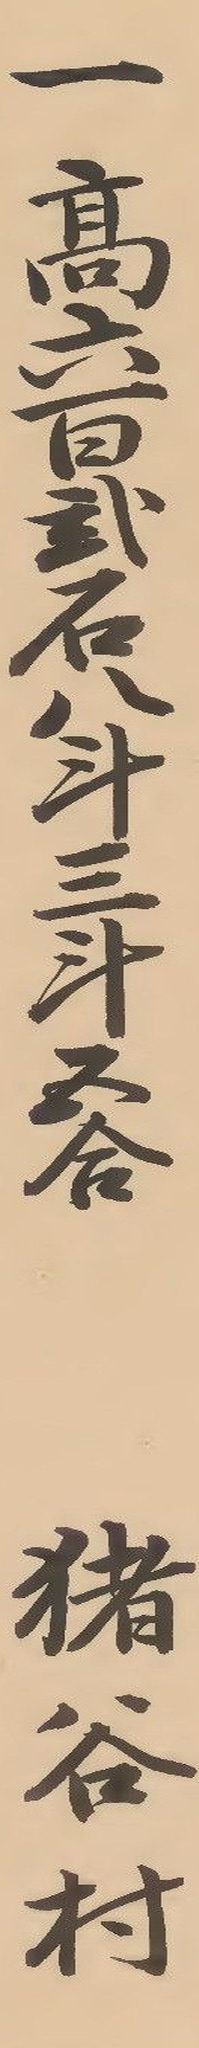一高六百弐石八斗三斗五合猪谷村
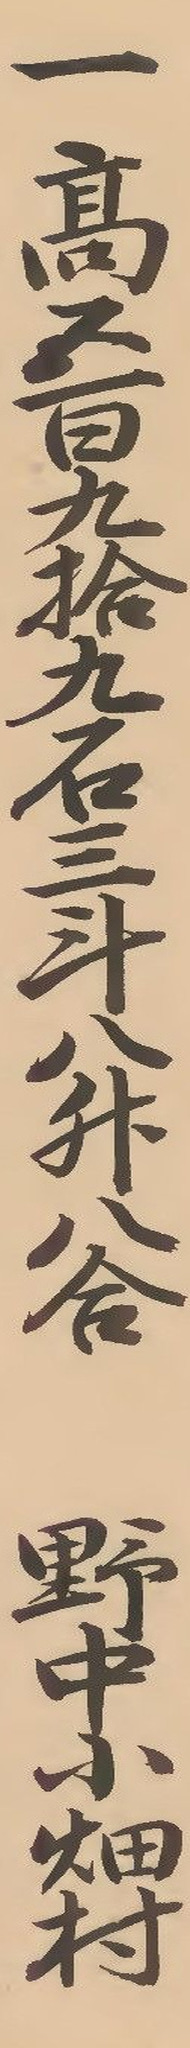一高五百九拾九石三斗八升八合野中小畑村
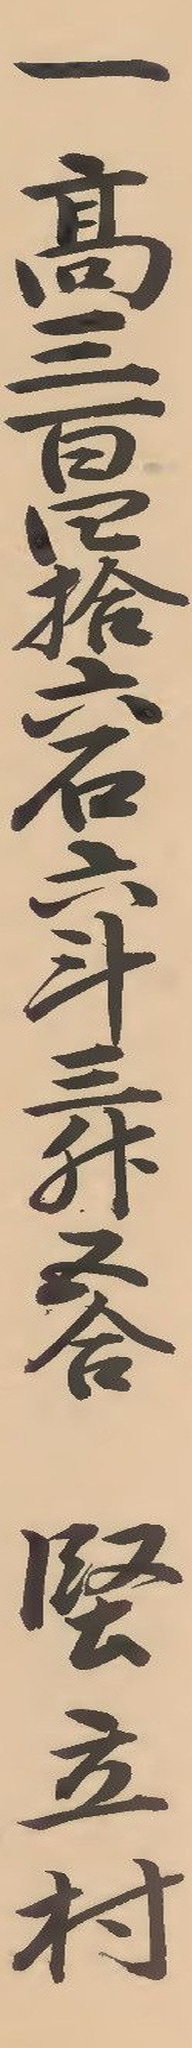一高三百四拾六石六斗三升五合堅立村

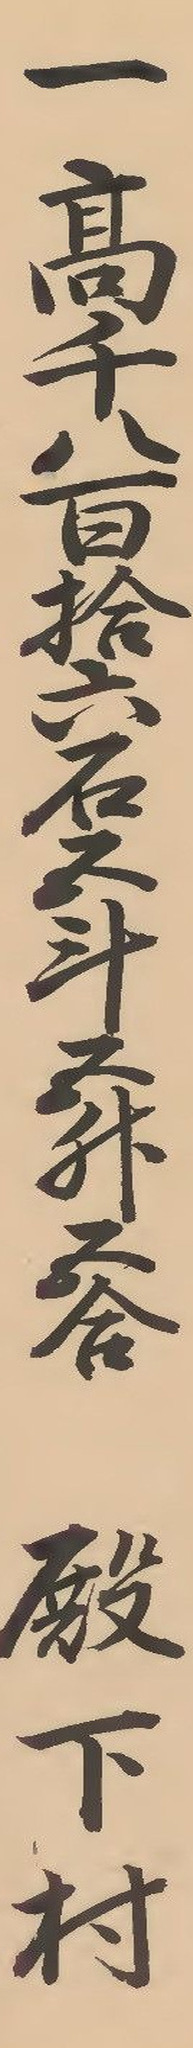一高千八百拾六石五斗五升五合殿下村
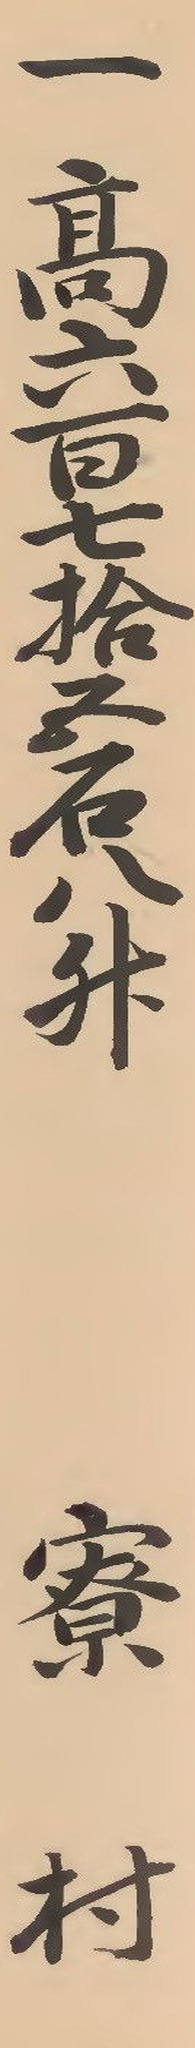一高六百七拾五石八升寮村
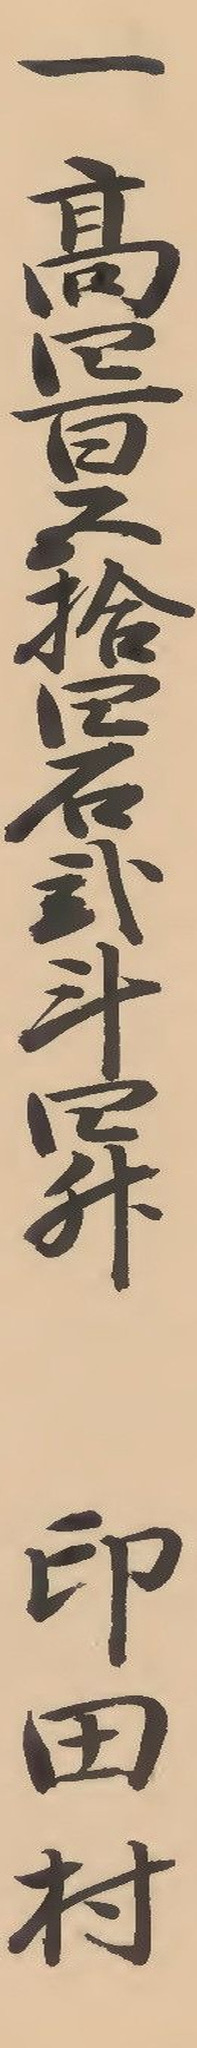一高四百五拾四石弐斗四升印田村
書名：越前国郷帳
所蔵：国立公文書館 National Archives of Japan
